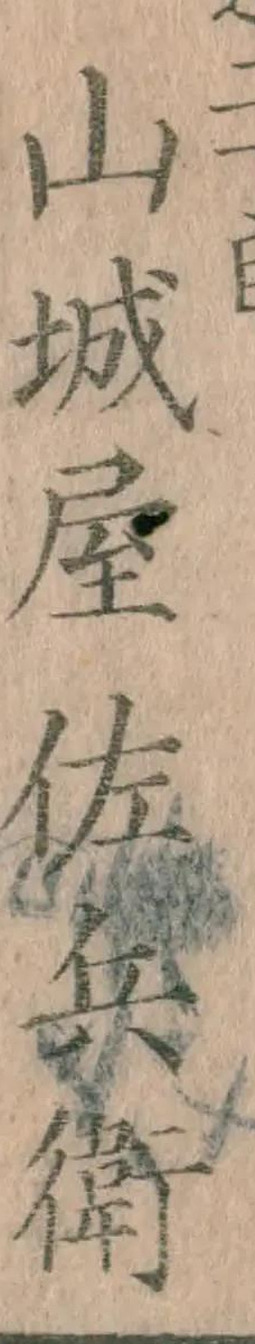山城屋佐兵衛
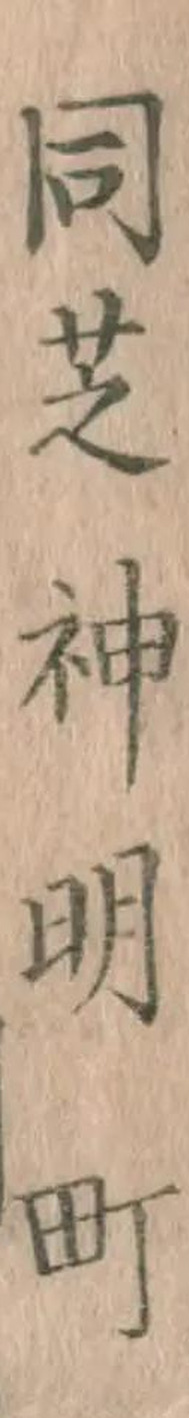同芝神明町
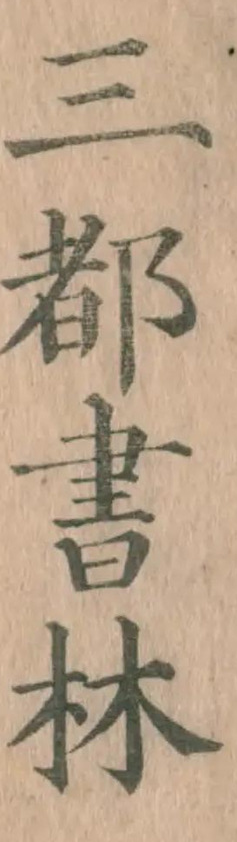三都書林
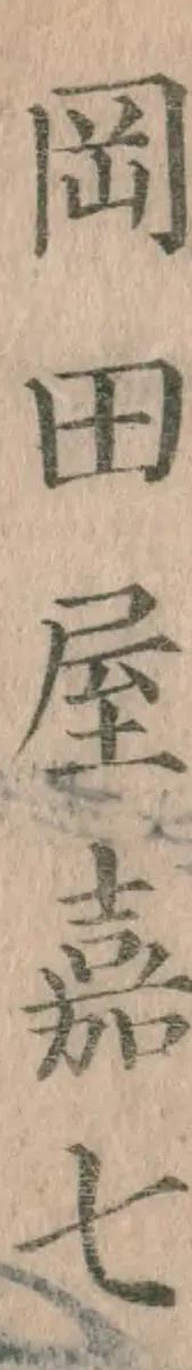岡田屋嘉七
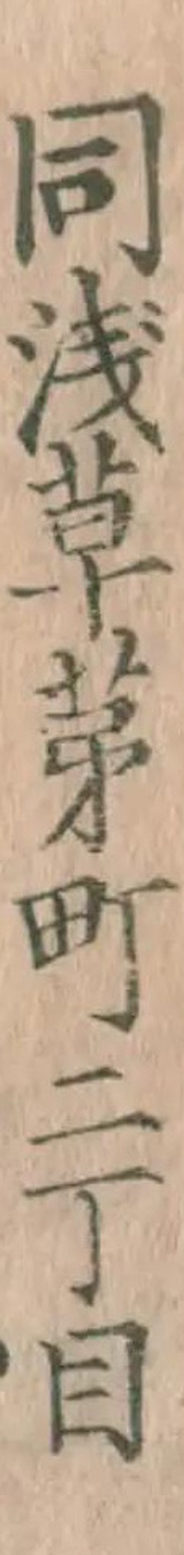同浅草茅町二丁目
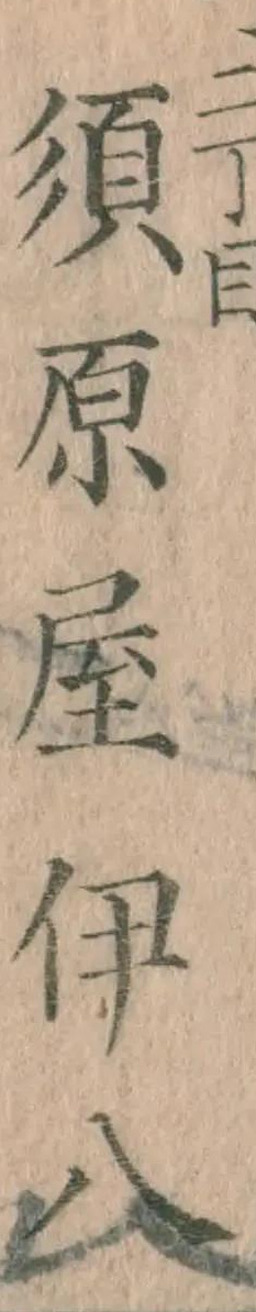須原屋伊八
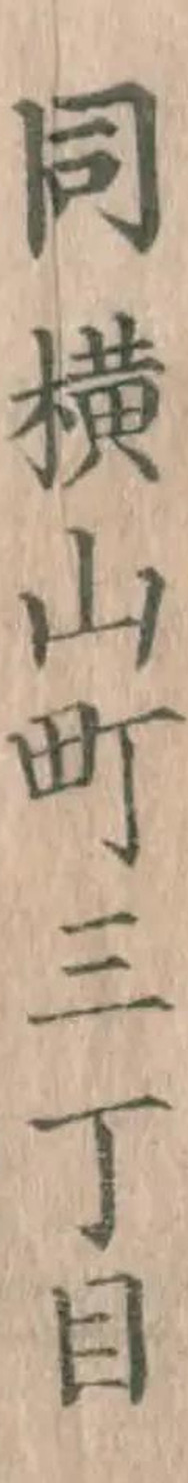同横山町三丁目
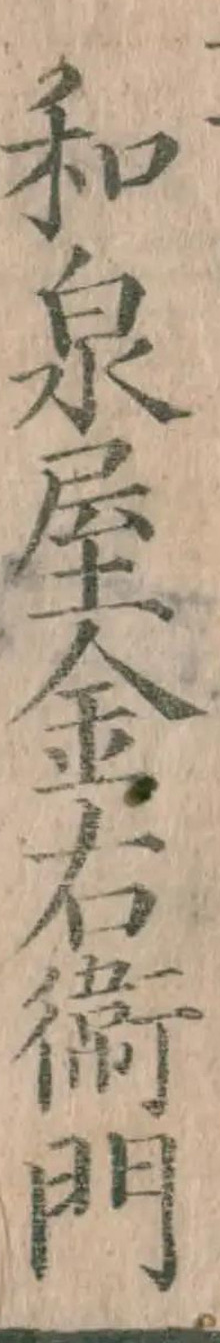和泉屋金右衛門
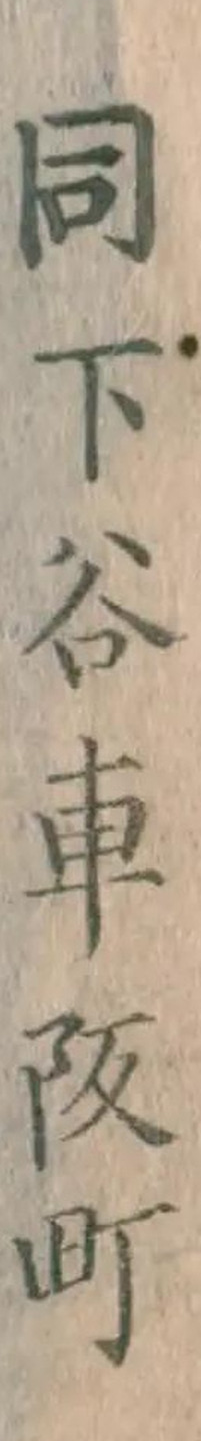同下谷車阪町
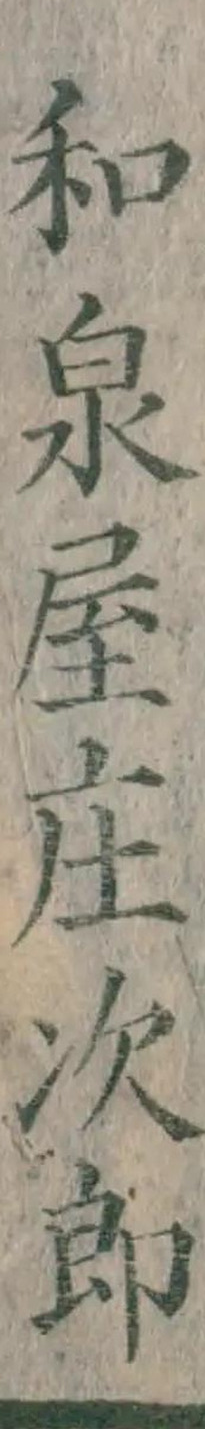和泉屋庄次郎
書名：機織彙編 5巻. [2]
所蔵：国立国会図書館 National Diet Library, JAPAN
